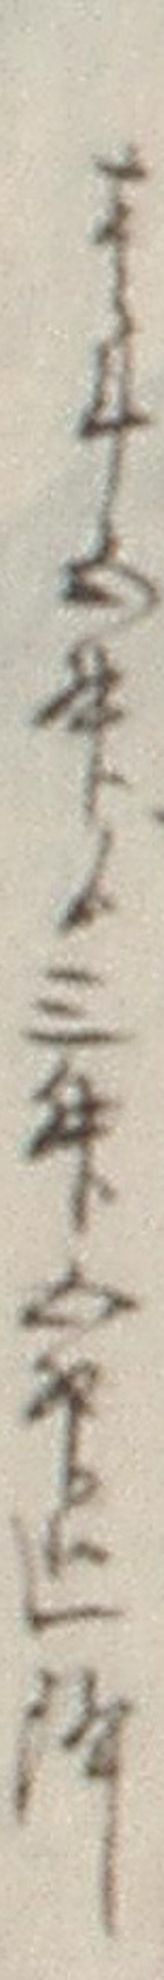壱斗五升ゟ三升五升迄降
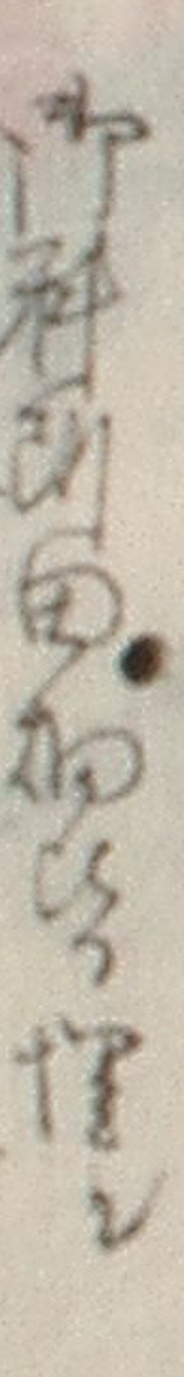御料所田畑皆埋レ
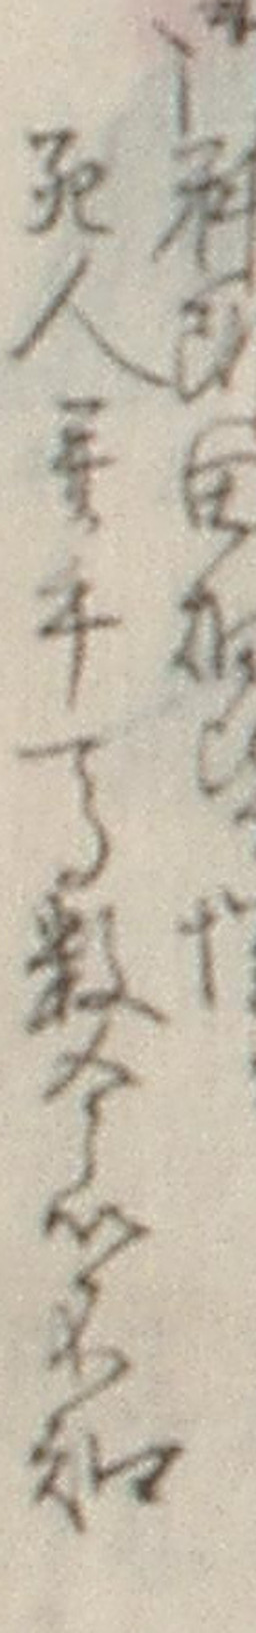死人幷牛馬数今以不知南

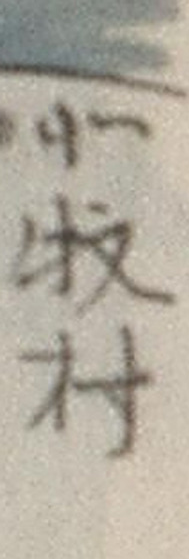北牧村
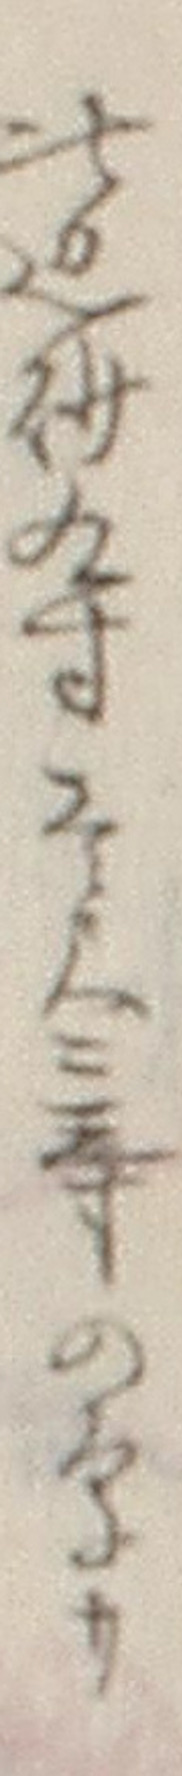此辺砂九寸壱尺三寸の厚サ
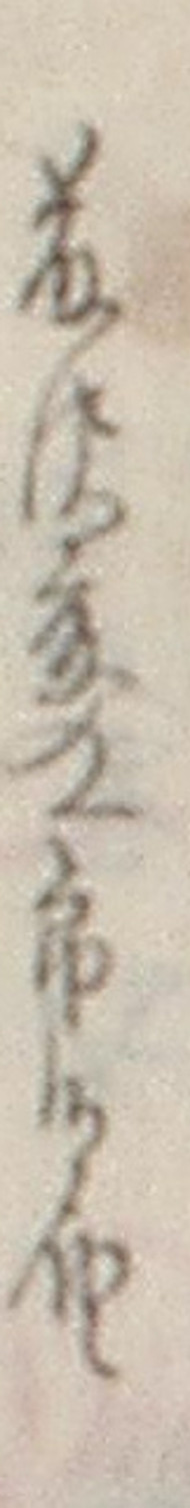藤沢藤九郎御届
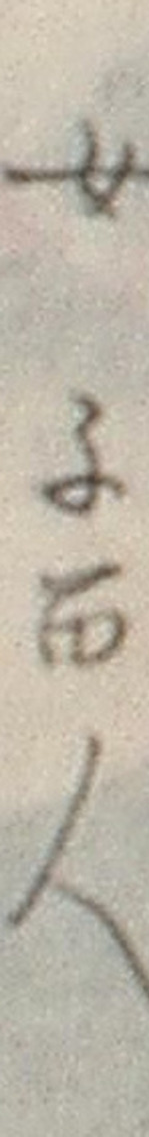女千百人
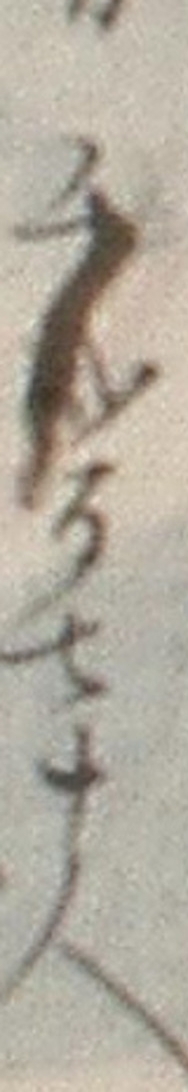男千弐百七十人
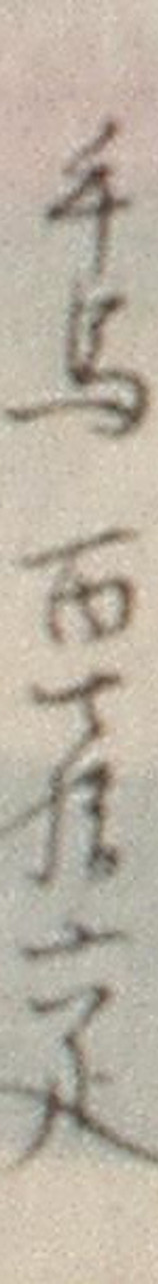牛馬百七十六疋
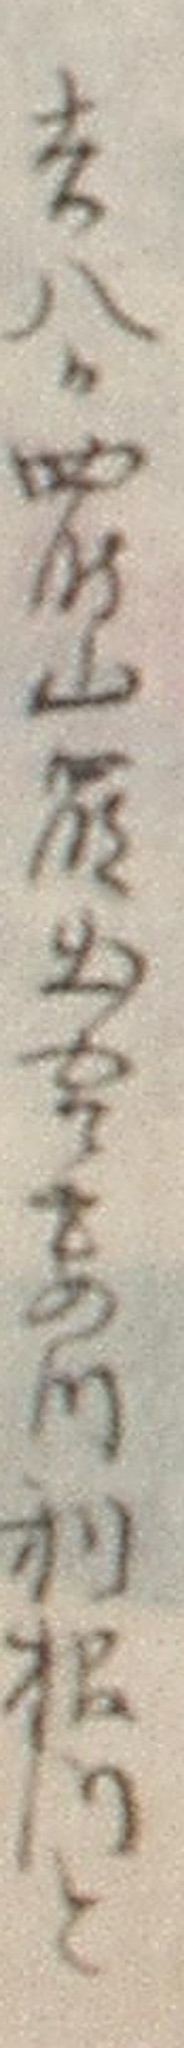去八日四時山崩出吾妻川利根川と
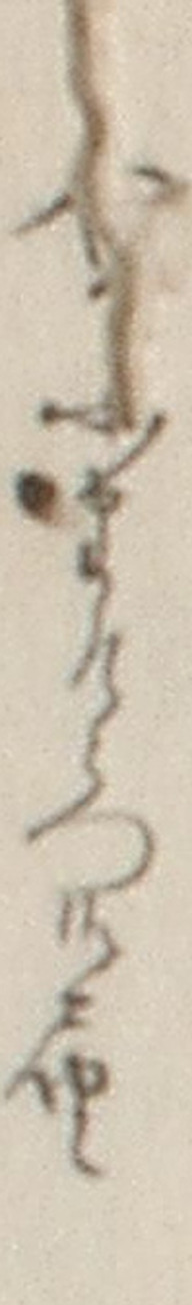遠藤兵左衛門御届
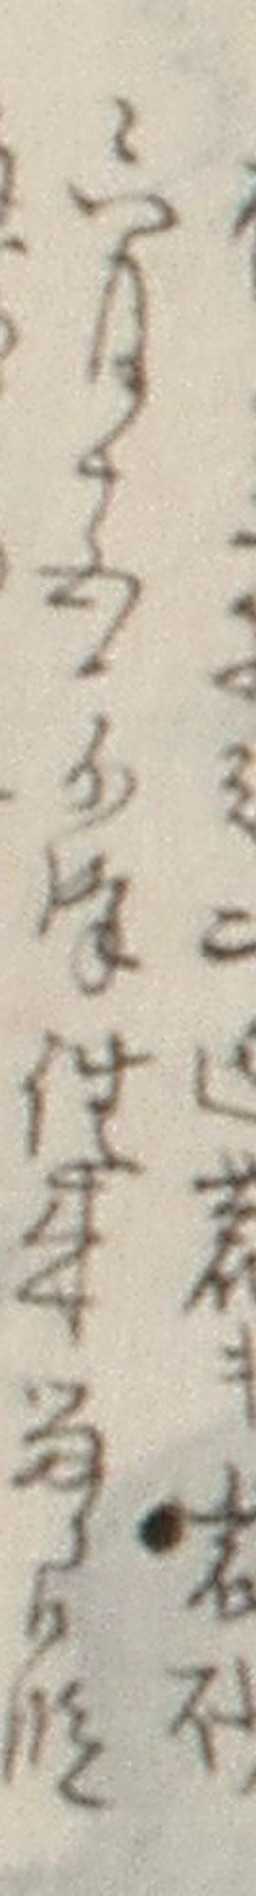流る六月十五日不降往来留候段
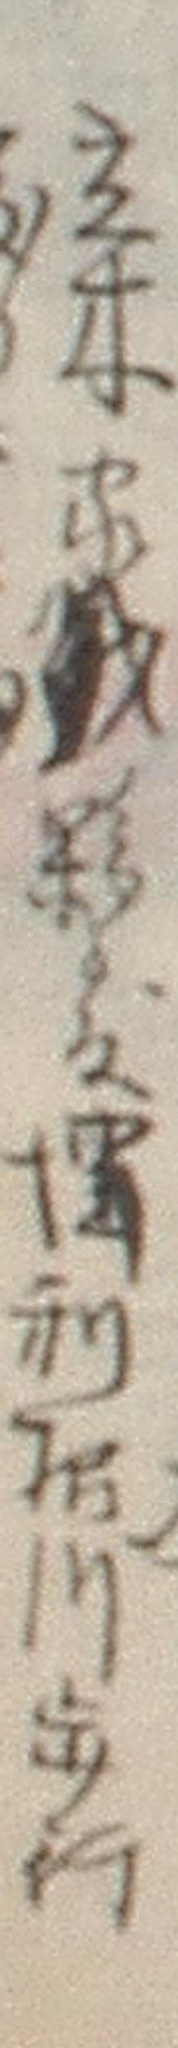立木家夥敷埋利根川歩行
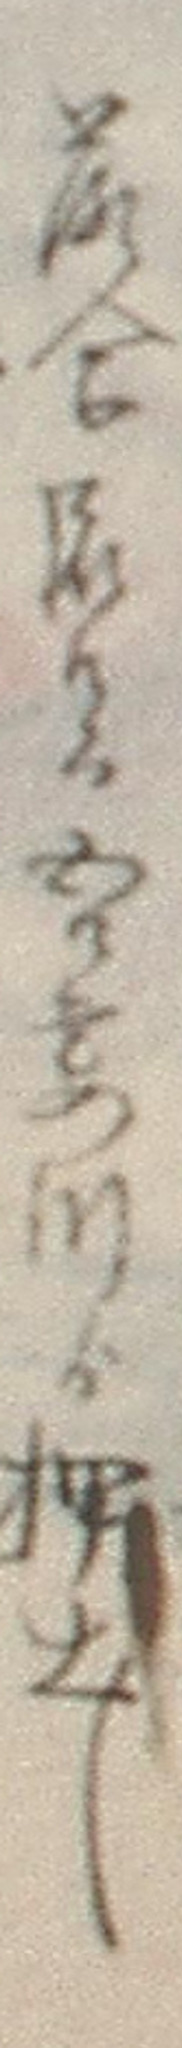落合流候而吾妻川ゟ押出し
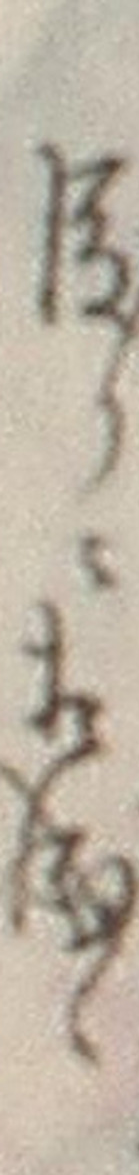渡りニ相成候
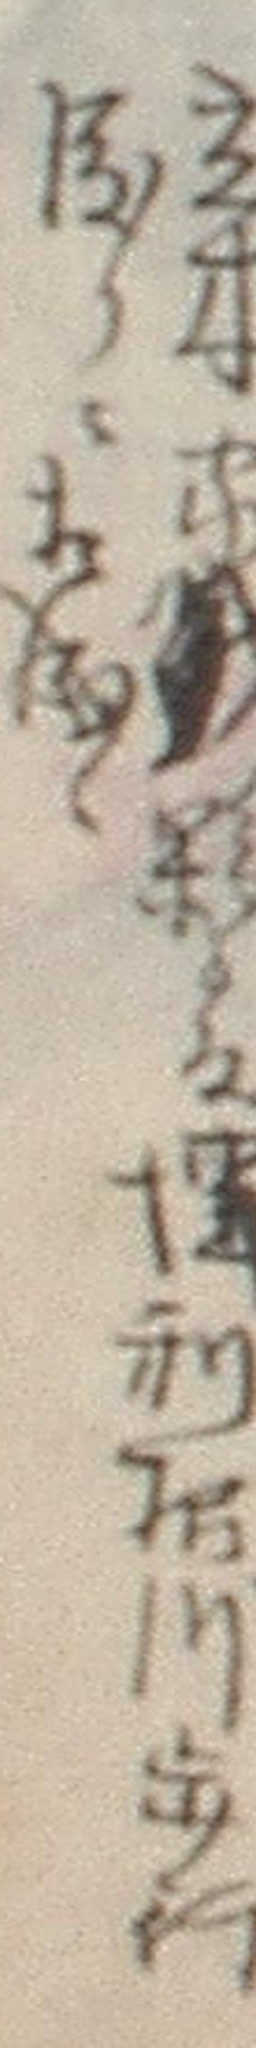渡りニ相成候
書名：[諸国災害記録]
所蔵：東京大学地震研究所図書室 Earthquake Research Institute Library, The University of Tokyo, JAPAN
